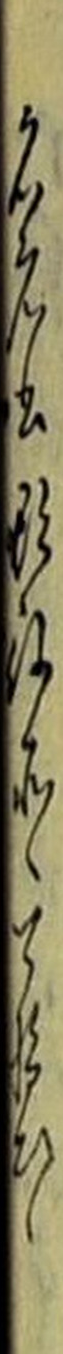名元書郡役所へ可差出候
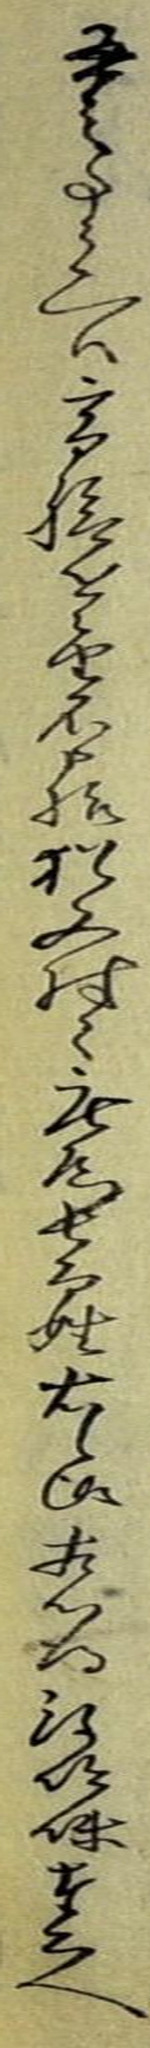有之事に候へは高給を望不申様猶又村々庄屋長百姓右之趣相心得致吟味奉公人
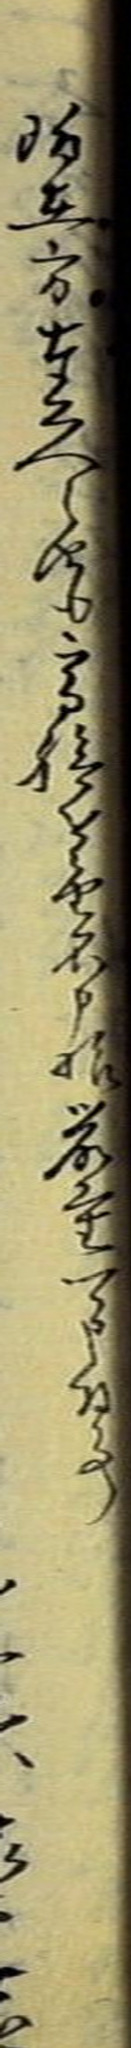附在方奉公人之儀も高給を望不申様厳重可申付事
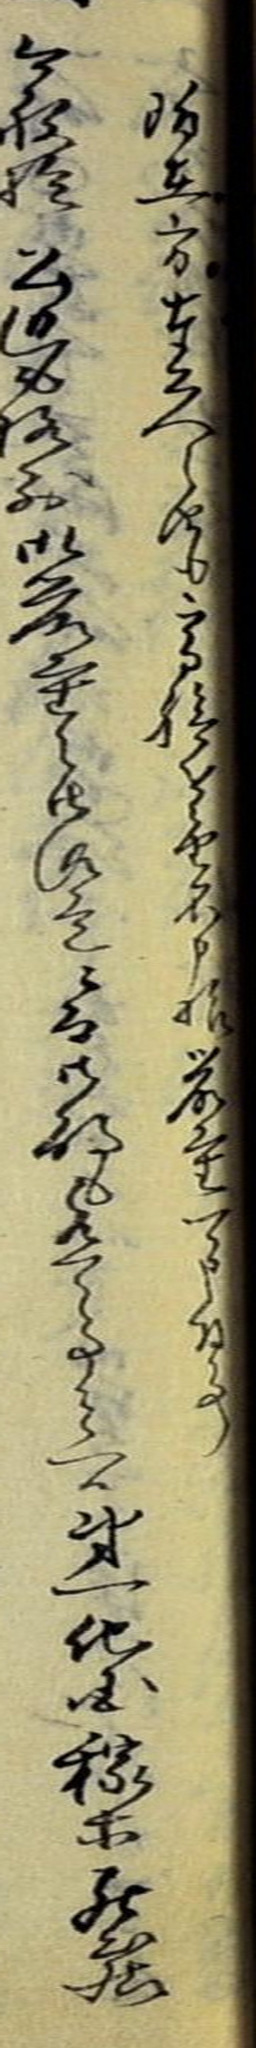一今般於公辺も格別御厳重之御趣意に而御触も有之事に候へは第一他国稼等罷出居
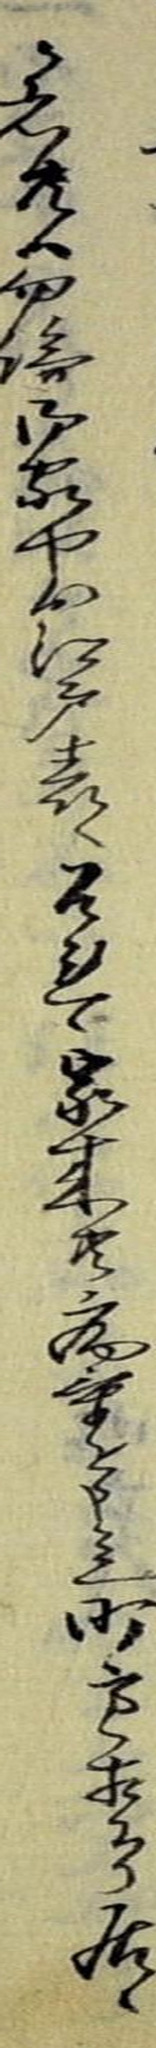候者共は勿論御家中ゟ江戸表へ召連候家來共病気を申立町方へ相下り居候
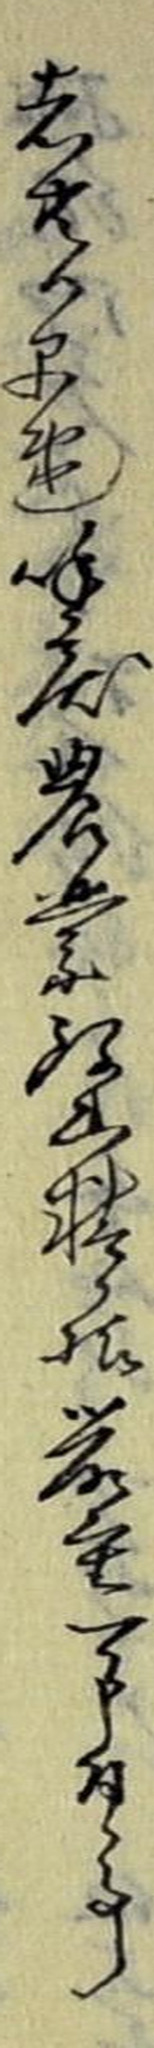者共は早速呼戻農業致出精候様厳重可申付候事
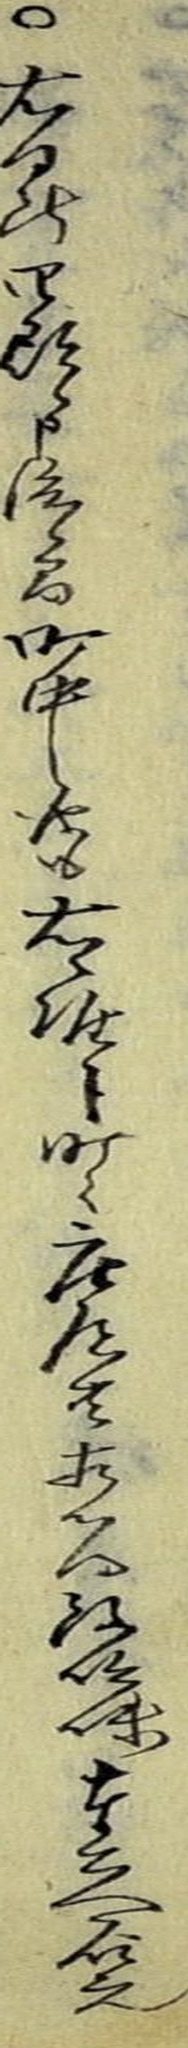○右同断四郡へ申渡候間町中之儀も右に准し町之庄屋共相心得致吟味奉公人名元
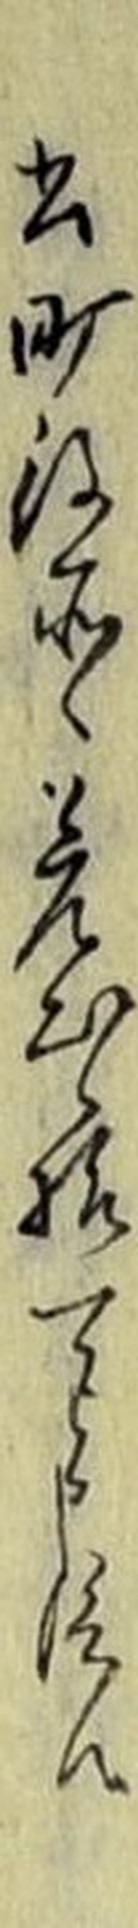書町役所へ差出候様可被申渡候
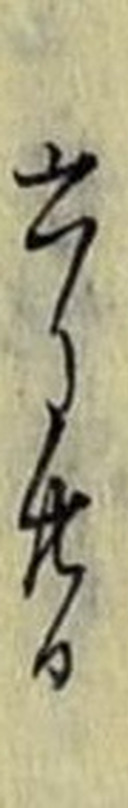六月廿日
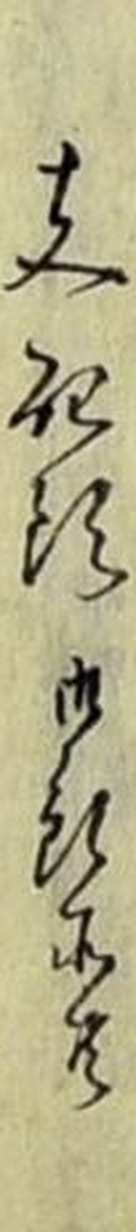支配頭御預所共
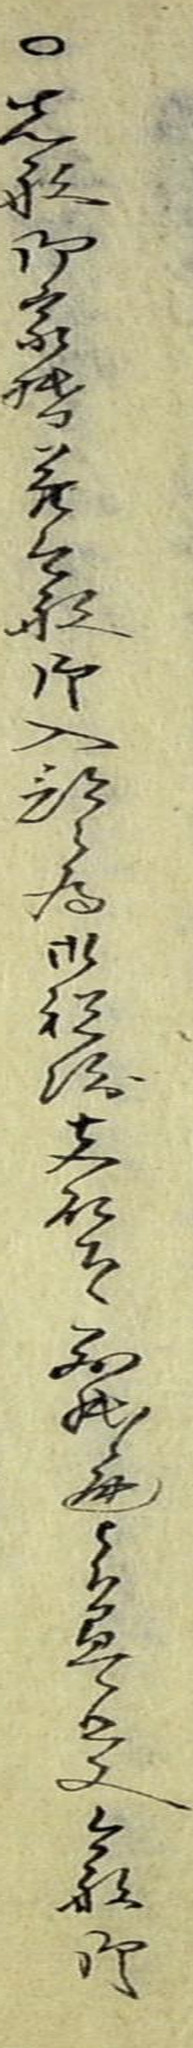○先般御家督并今般御入部之為御祝儀支配下へ別紙之通被下置候且又今般御
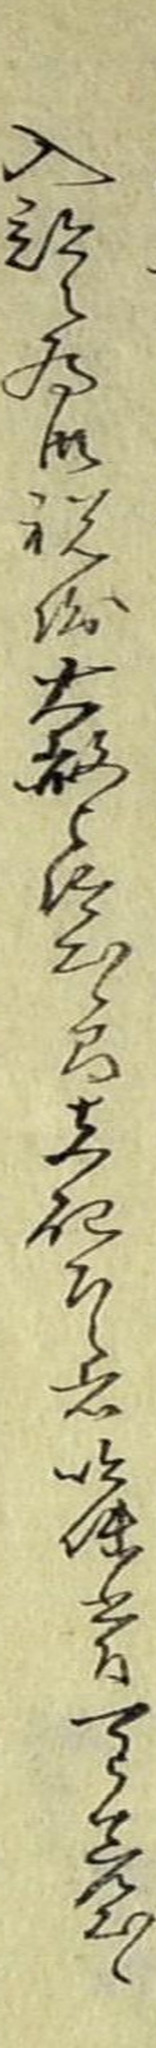入部之為御祝儀大赦被仰出候間支配下之者吟味書付可被差出候
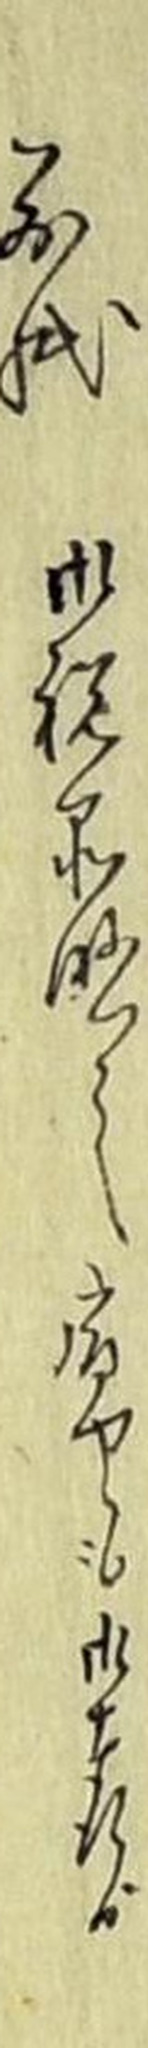別紙御祝品略之府中へも御奉行ゟ
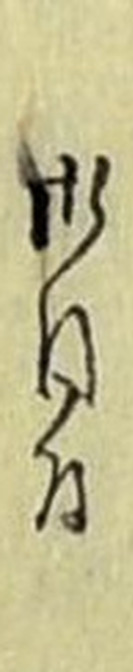御目付
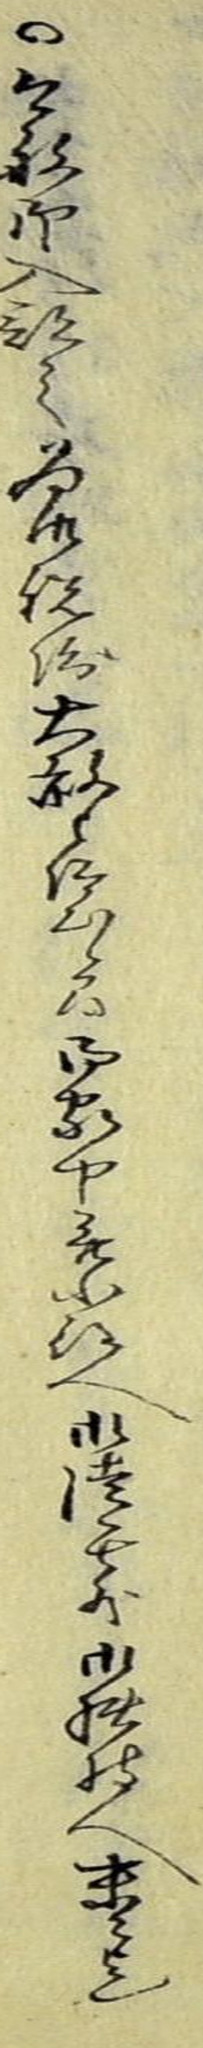○今般御入部之為御祝儀大赦被仰出候間御家中并小役人御徒其外御扶持人末々迄

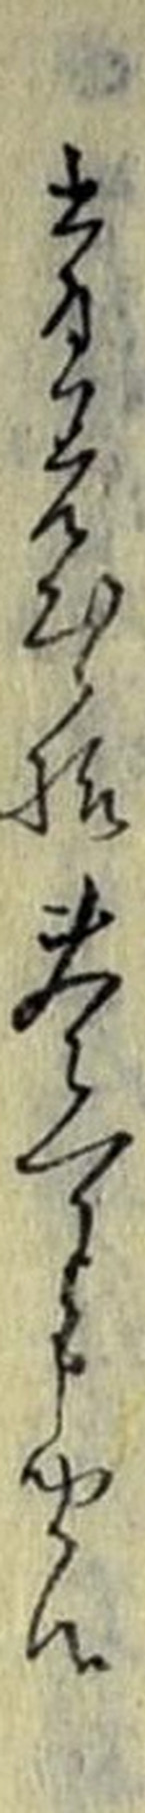書付差出候様夫々可被申聞候
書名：命令之部 六
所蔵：福井県文書館 Fukui Prefectural Archives
